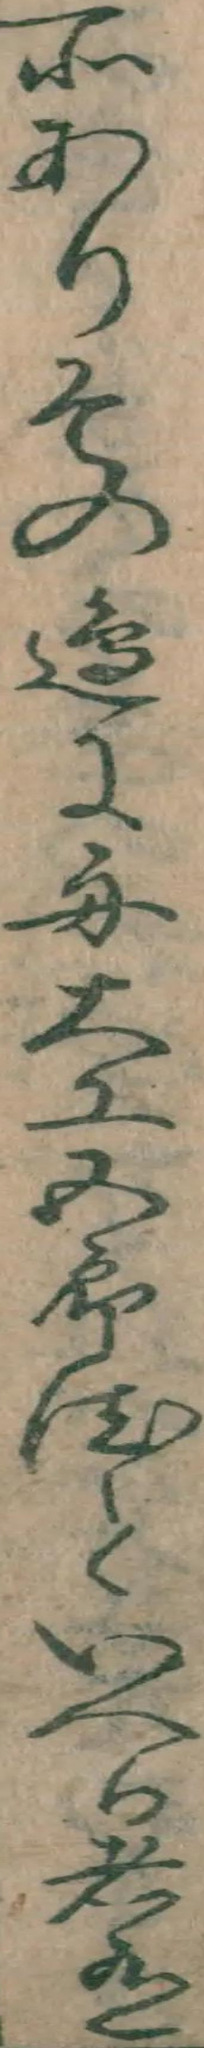所ありその辺に舟大工五郎徳といへる者有

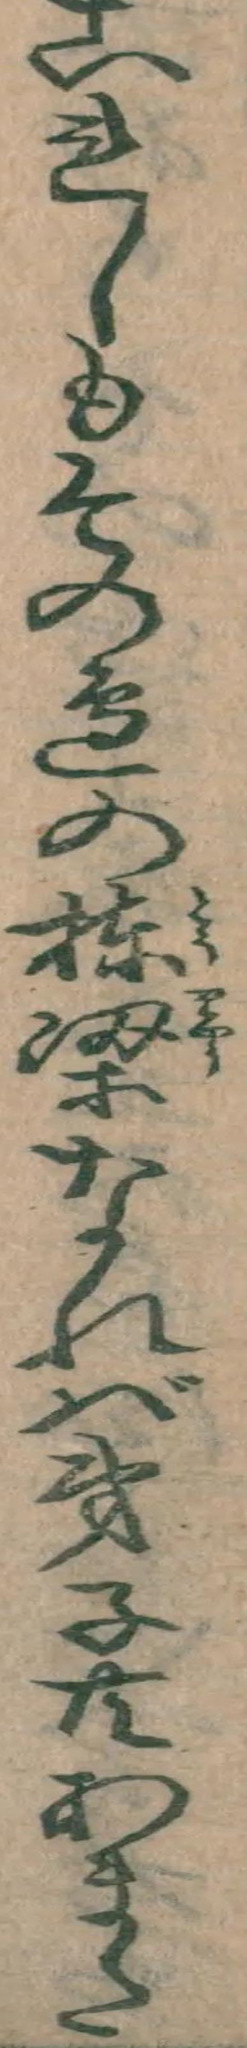これしもその辺の棟梁なれば弟子共あまた
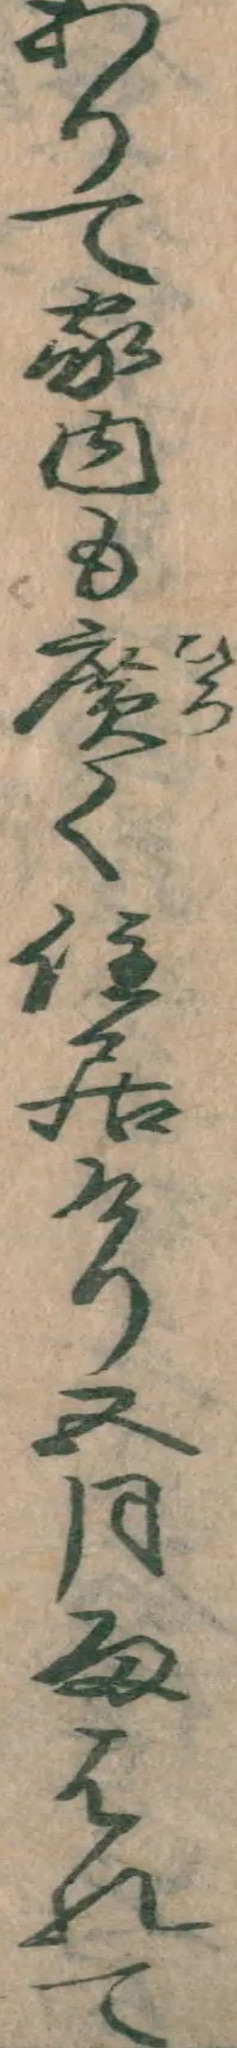ありて家内も広く住居けり五月雨はれて
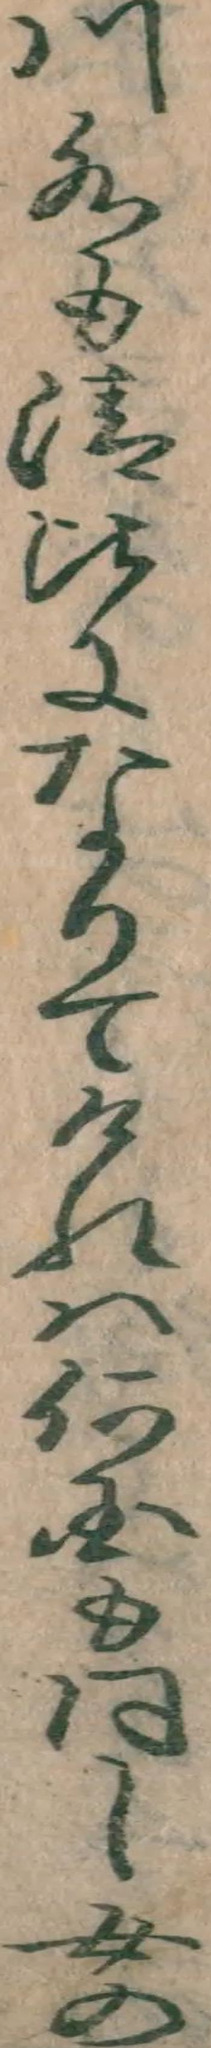川水も清頃になりてけれは何国も同し女の
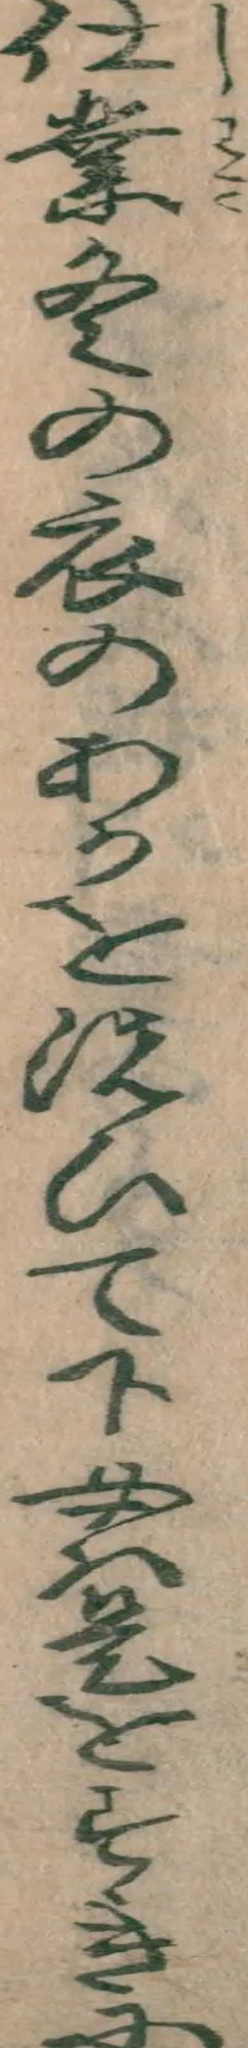仕業冬の衣のあかを洗ひて下女是をすゝきに
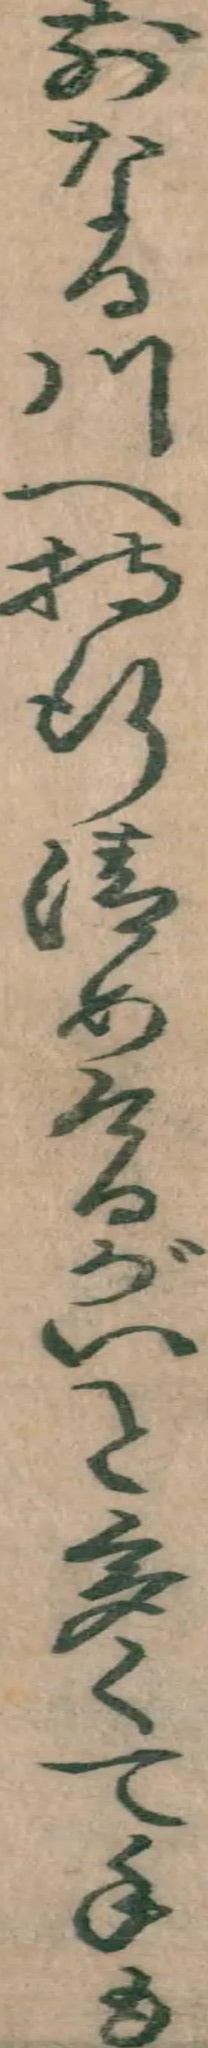前なる川へ持行清めけるがいと多くて手も
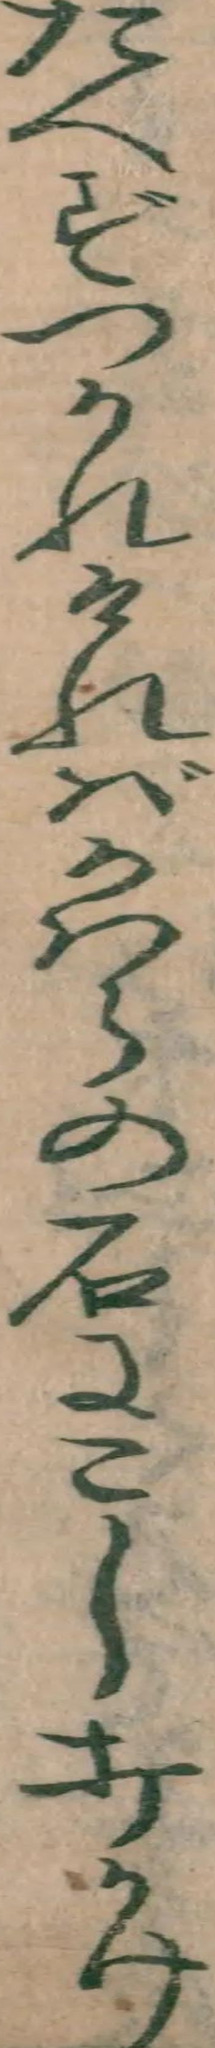たへずつかれければかはらの石にこし打かけ
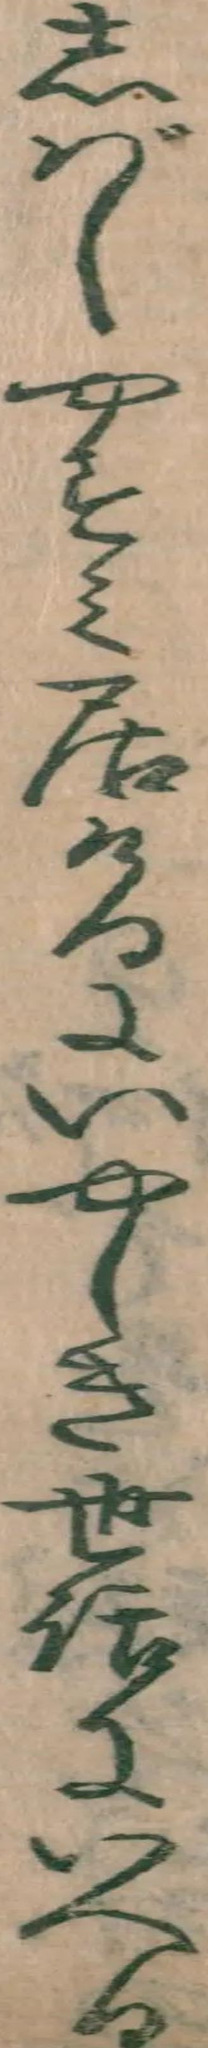しばしやすみ居けるにいやしき世話にいへる
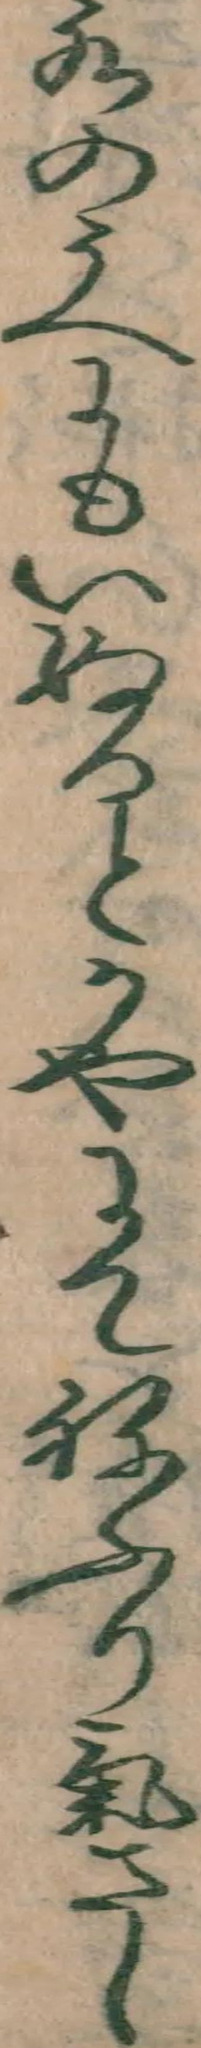水のうへにもいぬるとかやにてねふり気さし
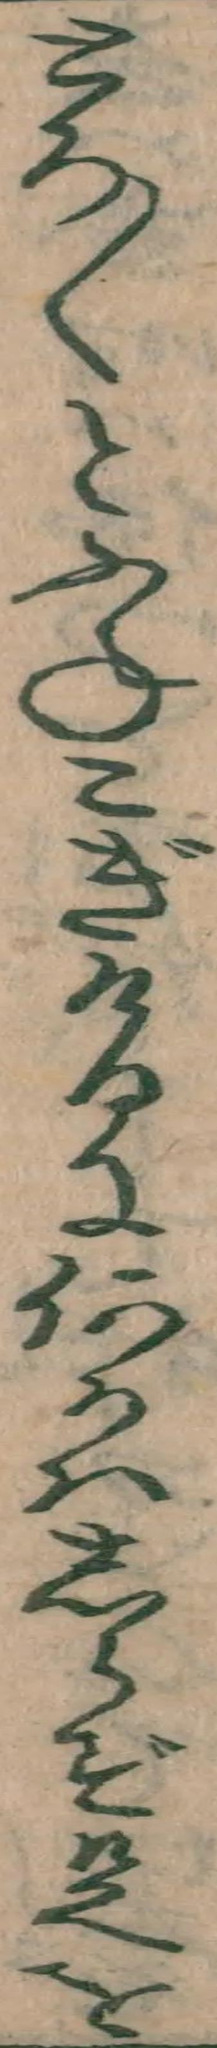とろ〳〵とふねこぎけるに何かはしらず足を
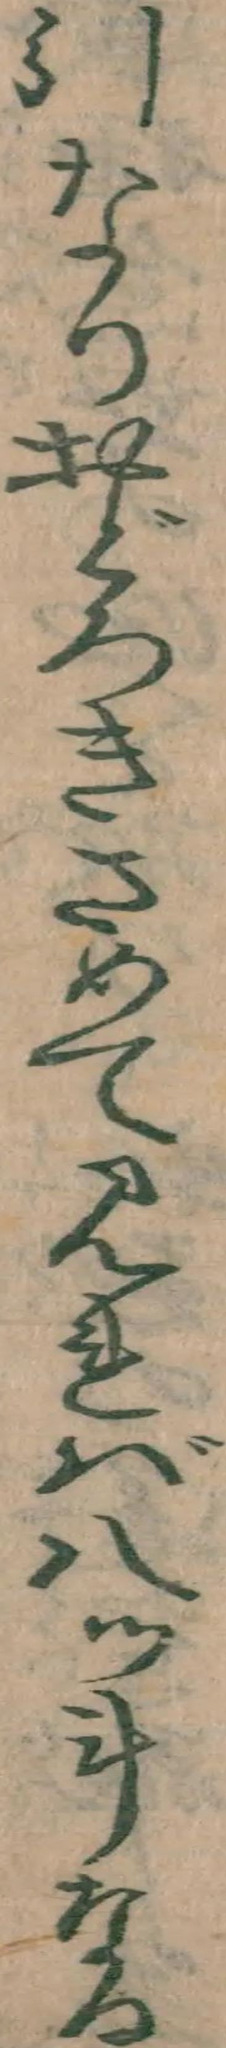引なりおどろきさめて見れば八つ斗なる
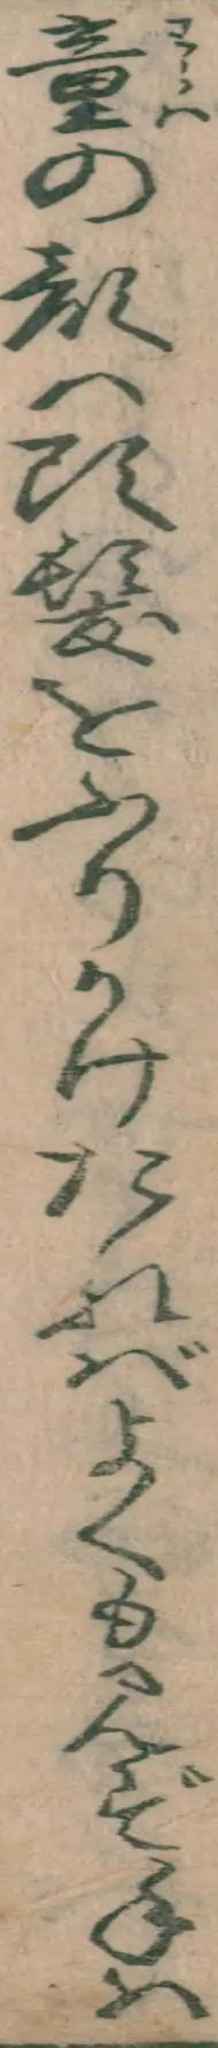童の顔は頭髪をふりかけたればよくも見ず手は
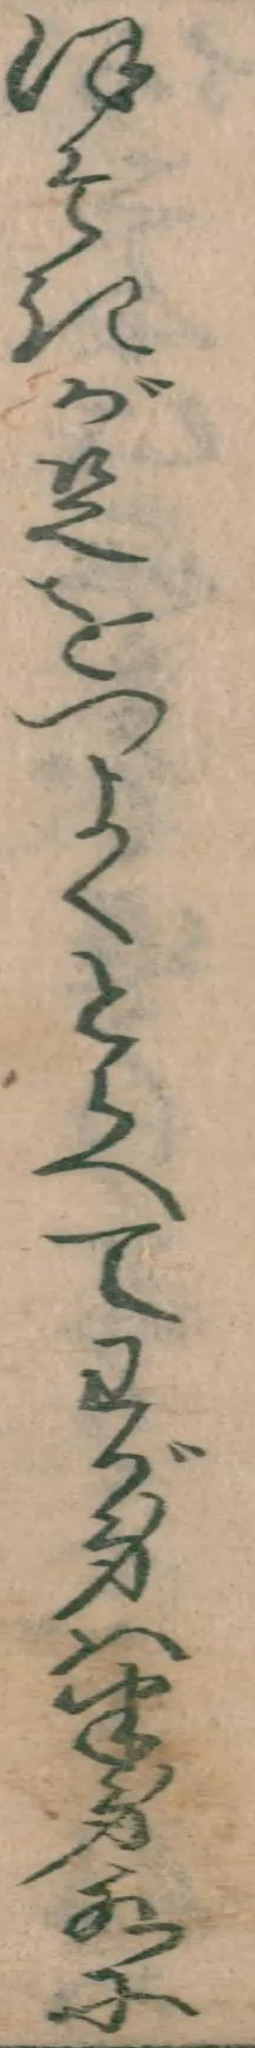ほそきが足をつよくとらへてわが身は半身水に
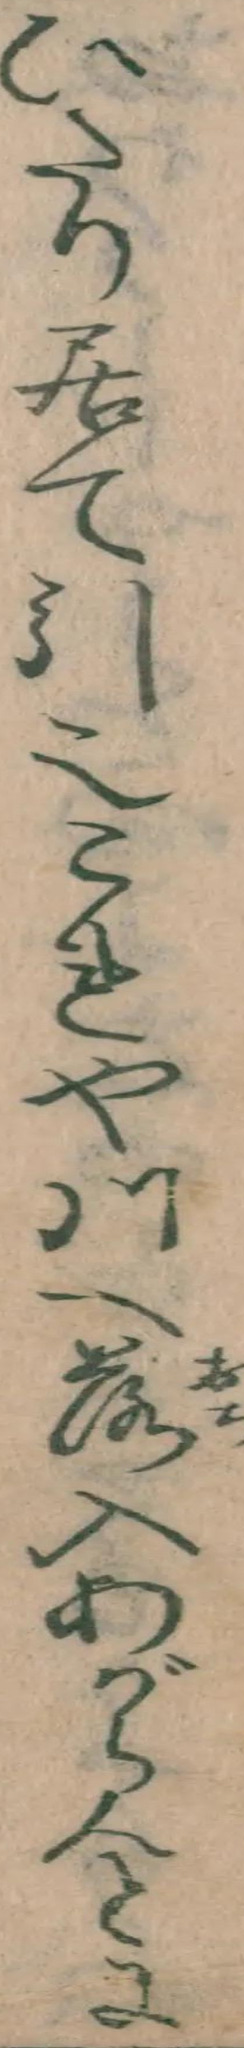ひたり居て引也これや川へ落入あがらんとに
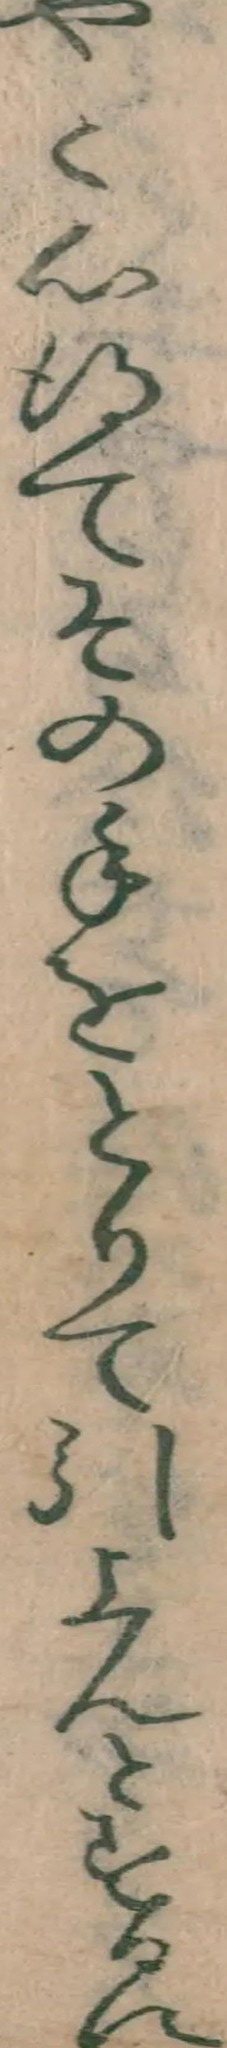やと心得てその手をとりて引上んとするに
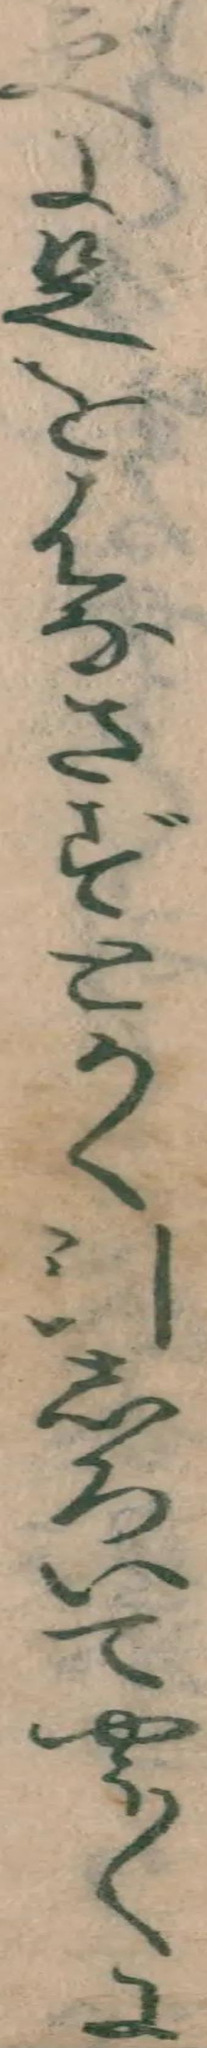更に足をはなさずとかく引しろいてやう〳〵に
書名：怪談御伽童 5巻. [1]
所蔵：国立国会図書館 National Diet Library, JAPAN
